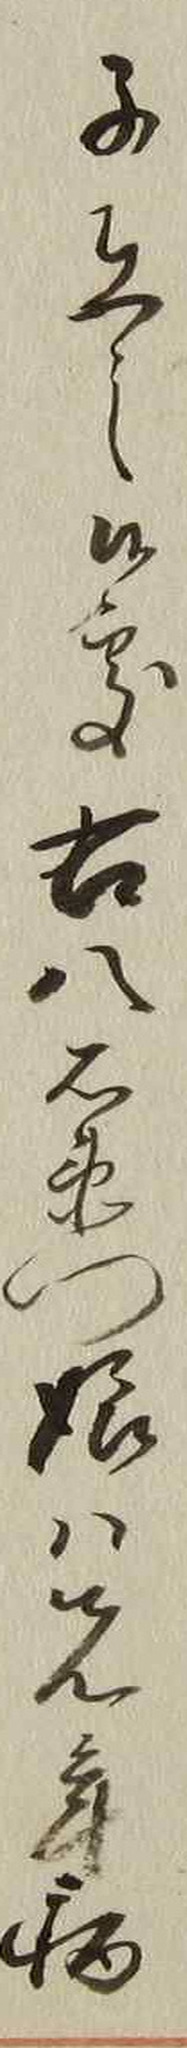子在之候処右八右衛門娘ハ先年病
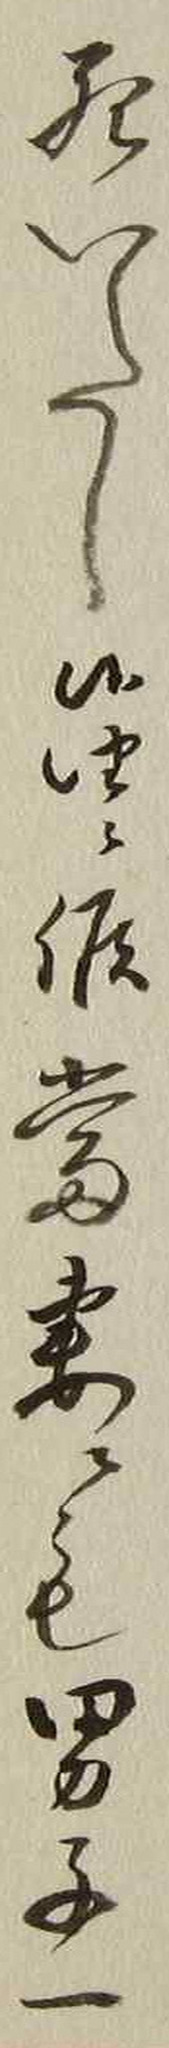死いたし候由ニ候当妻ニも男子一
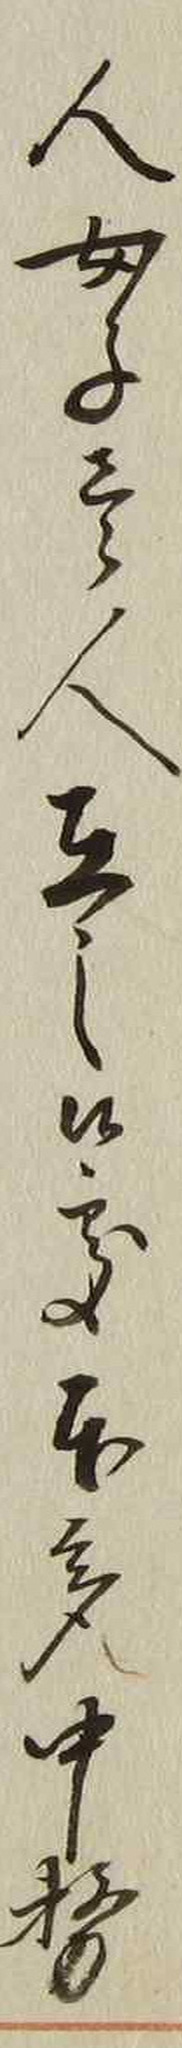人女子壱人在之候処本多中務
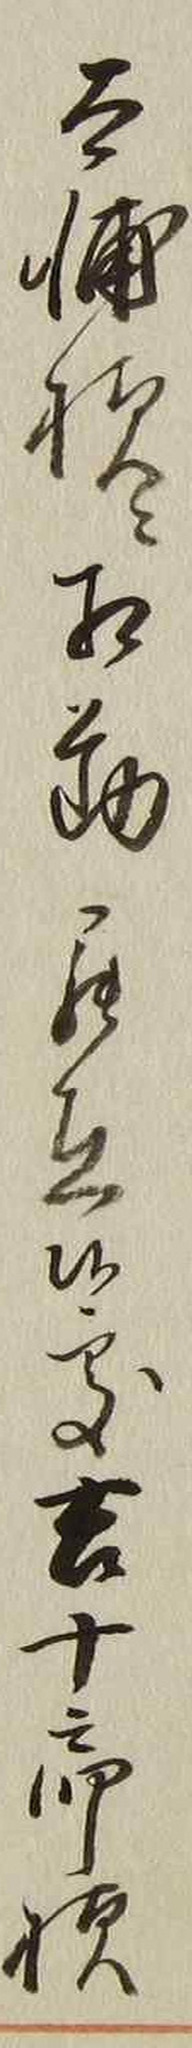太輔様ニ相勤罷在候処吉十郎様
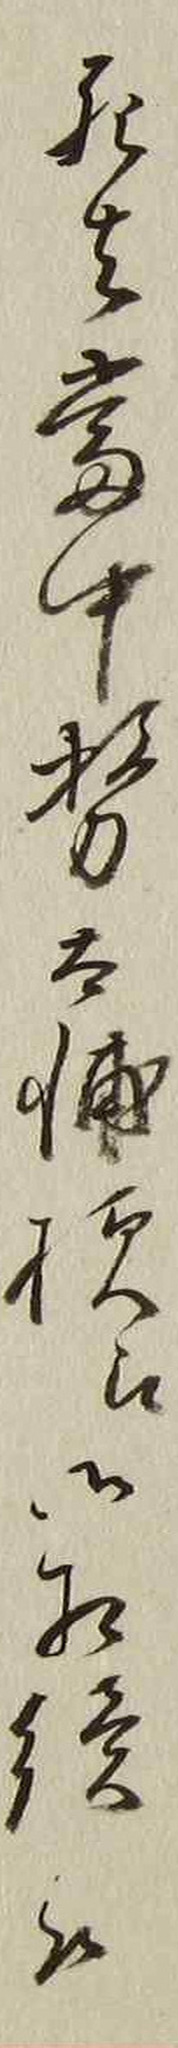死去当中務太輔様江御相続被
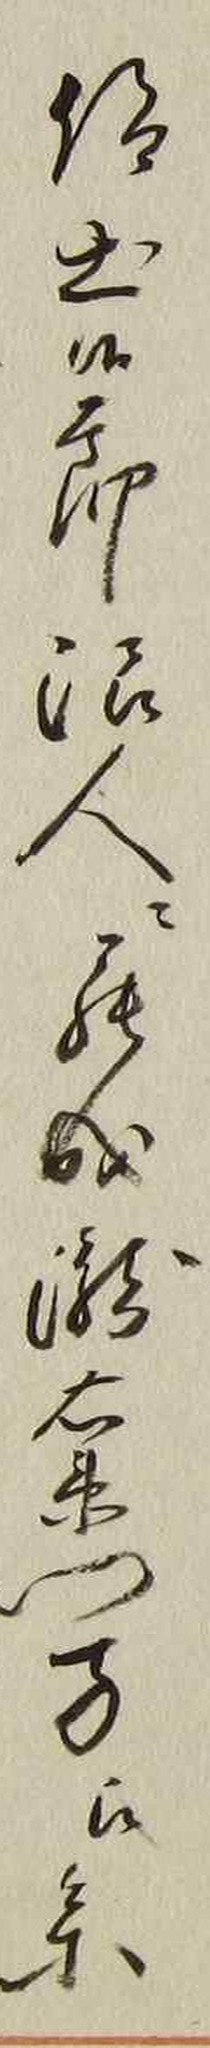仰出候節候浪人ニ罷成滝右衛門方江参
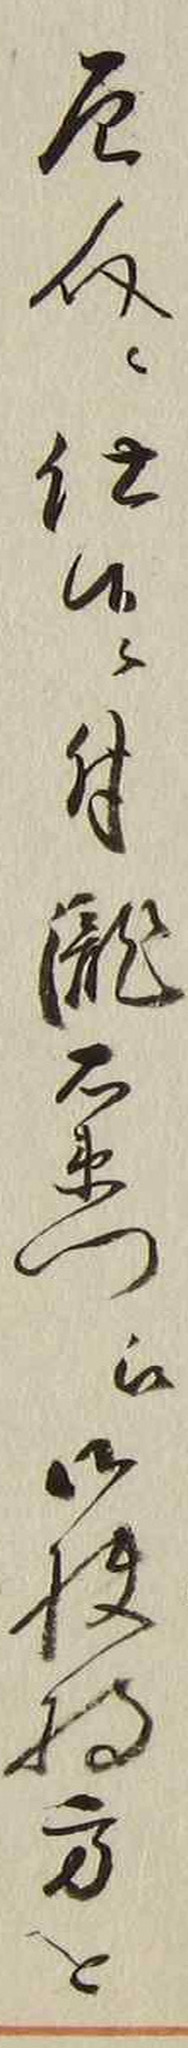厄介ニ仕候ニ付滝右衛門江御扶持方を
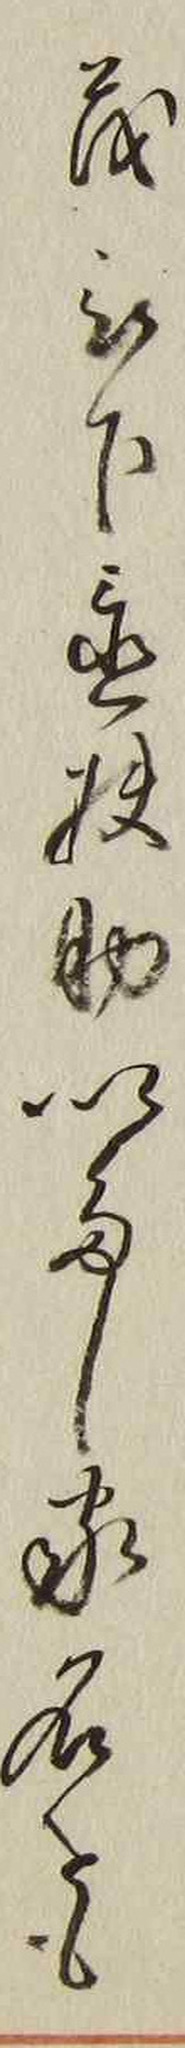も被下置扶助いたし家名をも
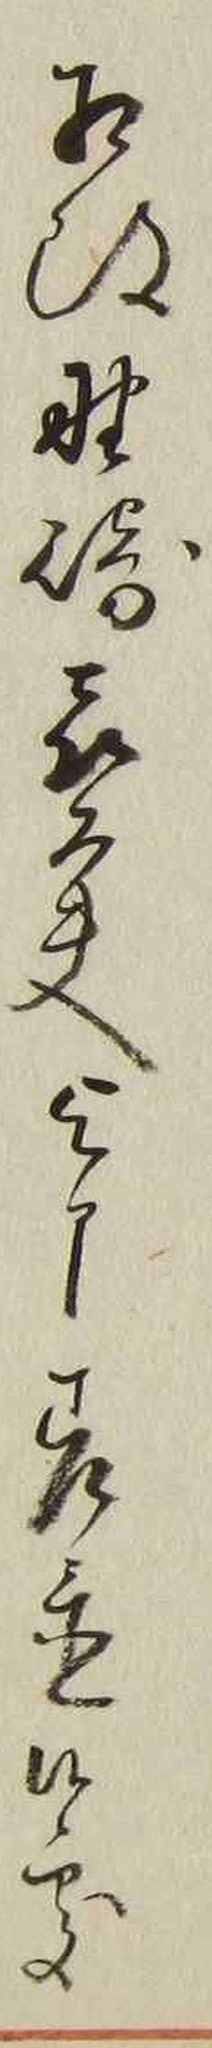相改野崎喜大夫与申差置候処

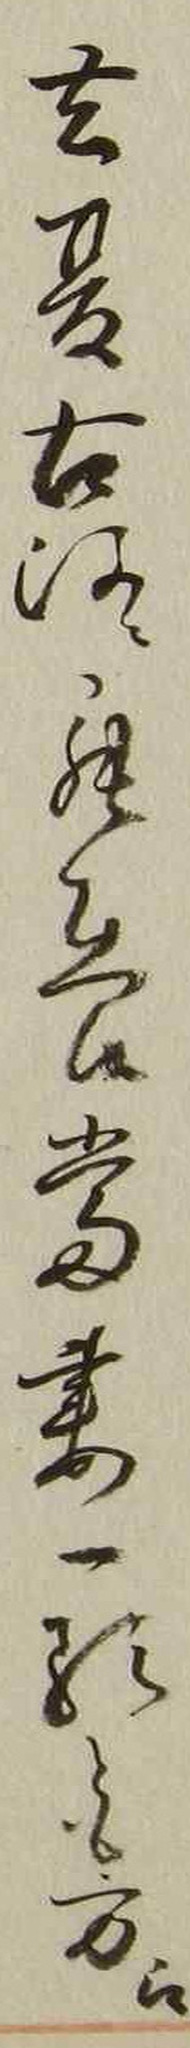去夏古河ニ罷在候当妻一類とも方江
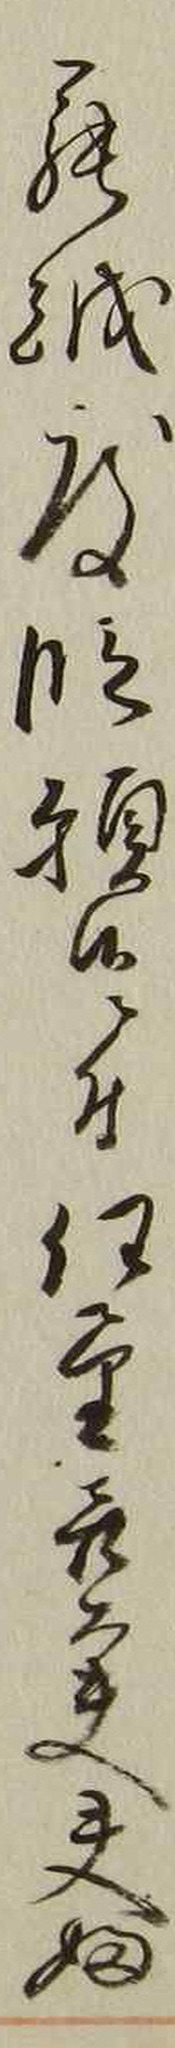罷越度段願候ニ付任望喜大夫夫婦
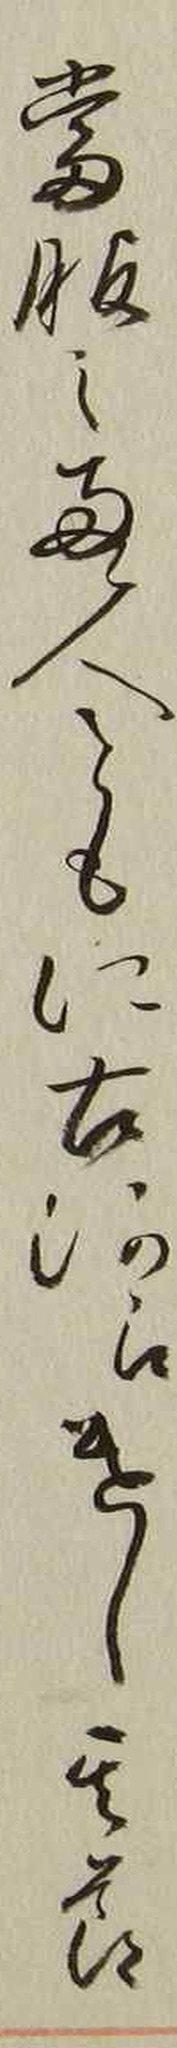当腹之両人ともに古河江遣候其節
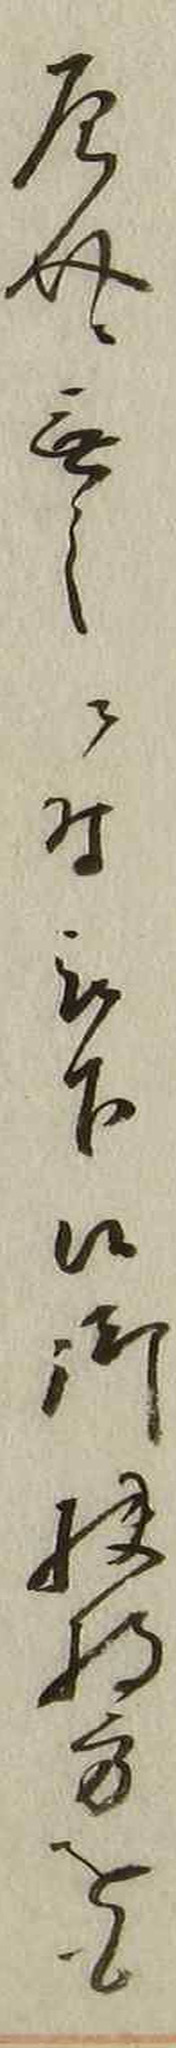厄介ニ無之ニ付被下候御扶持方をも
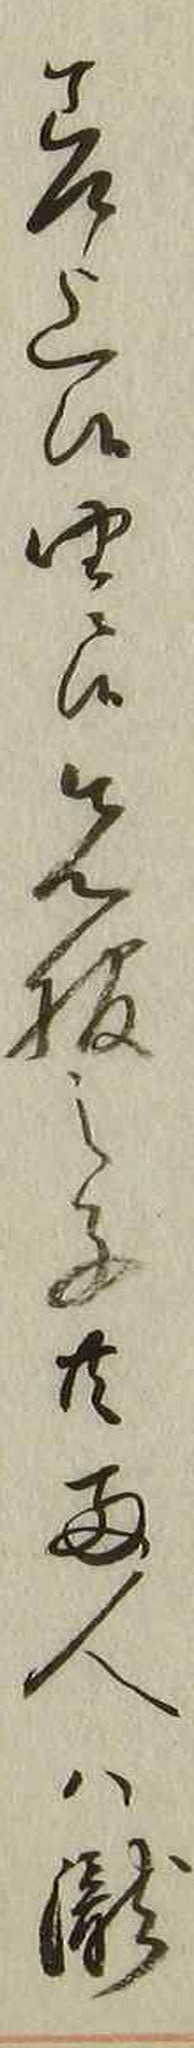差上候由ニ候先腹之子共両人ハ滝
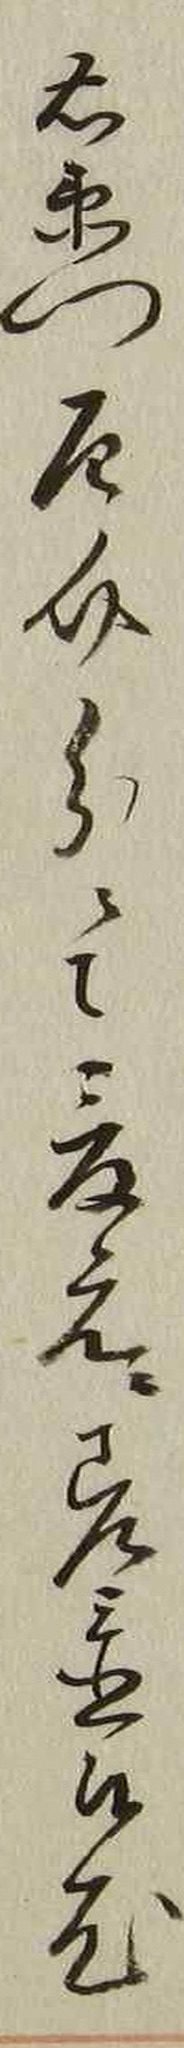右衛門厄介分ニて爰元ニ差置候尤
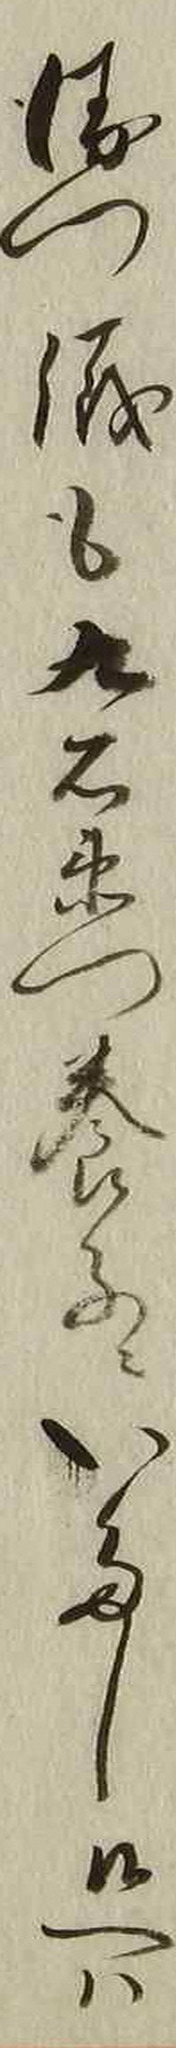衛門儀も九右衛門養子ニいたし候へハ
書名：諸士系譜　巻之122　よ之部5
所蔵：会津若松市立会津図書館
